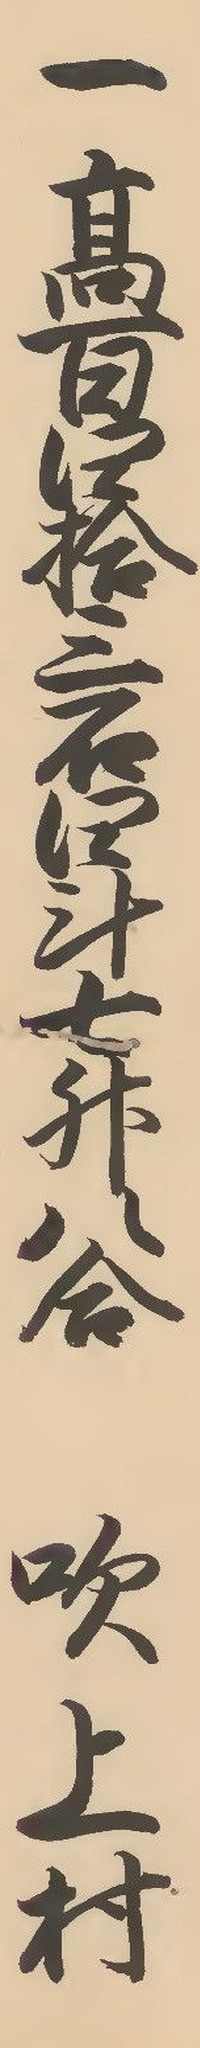一高百四拾三石四斗七升八合吹上村

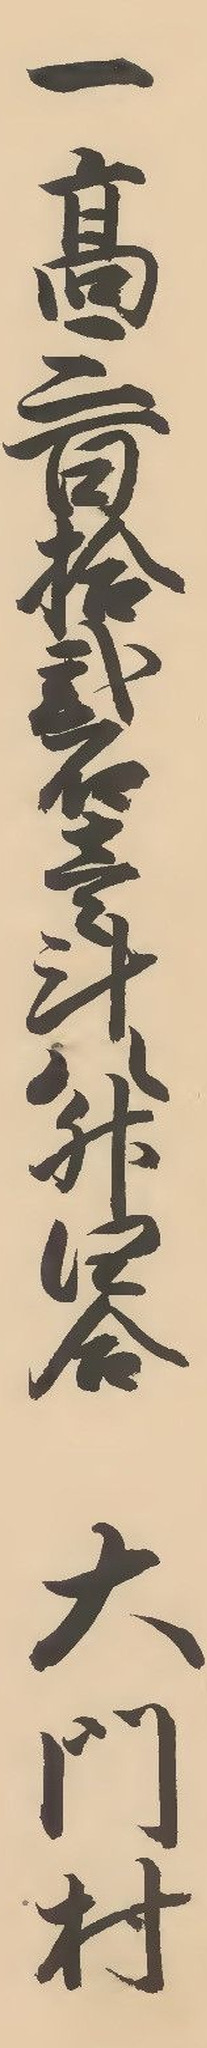一高三百拾弐石壱斗八升四合大門村
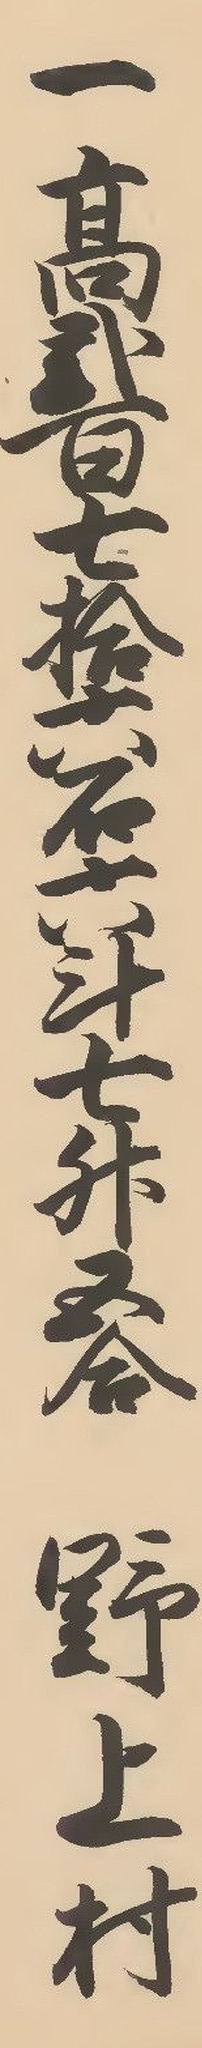一高弐百七拾六石六斗七升五合野上村
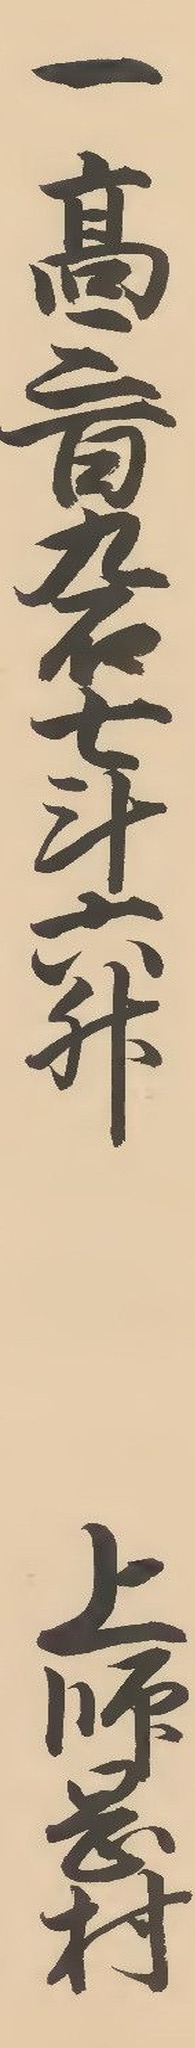一高三百九石七斗六升上師岡村
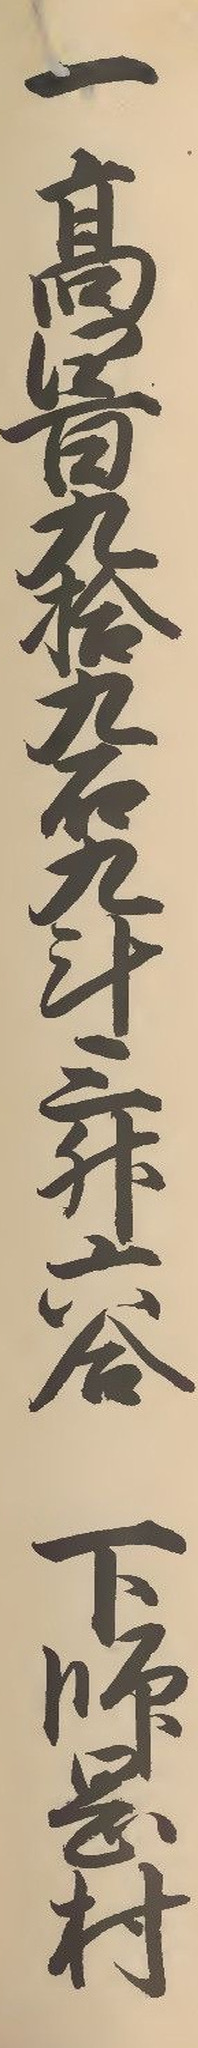一高四百九拾九石九斗三升六合下師岡村
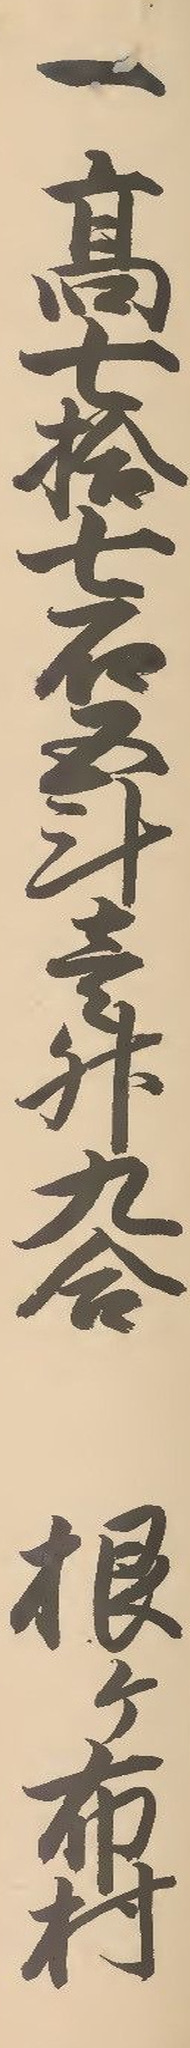一高七拾七石五斗壱升九合根ヶ布村
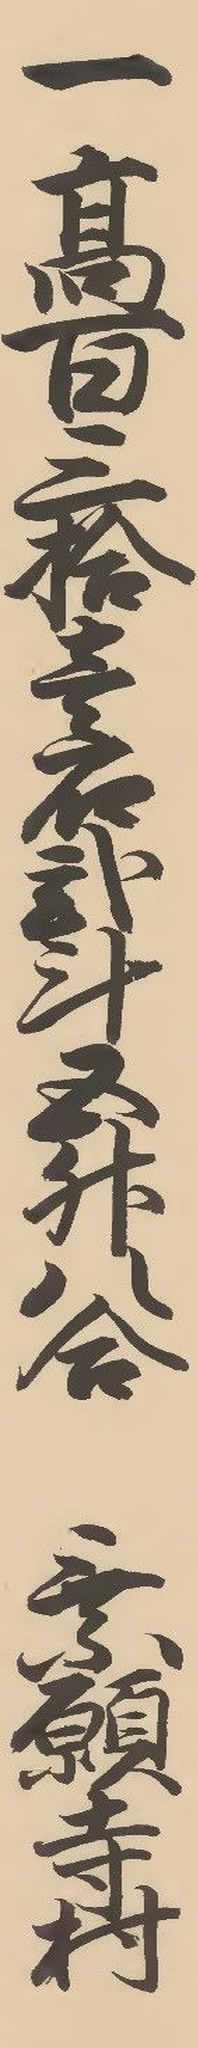一高百三拾壱石弐斗五升八合乗願寺村
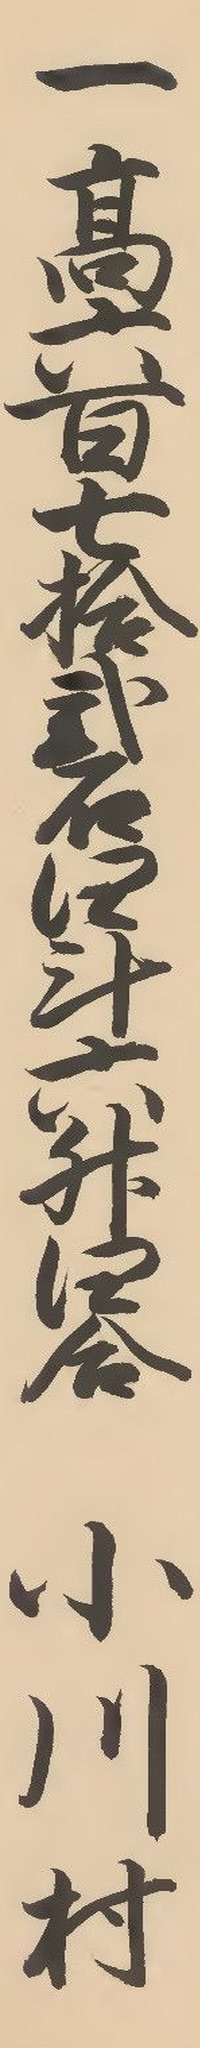一高六百七拾弐石四斗六升四合小川村
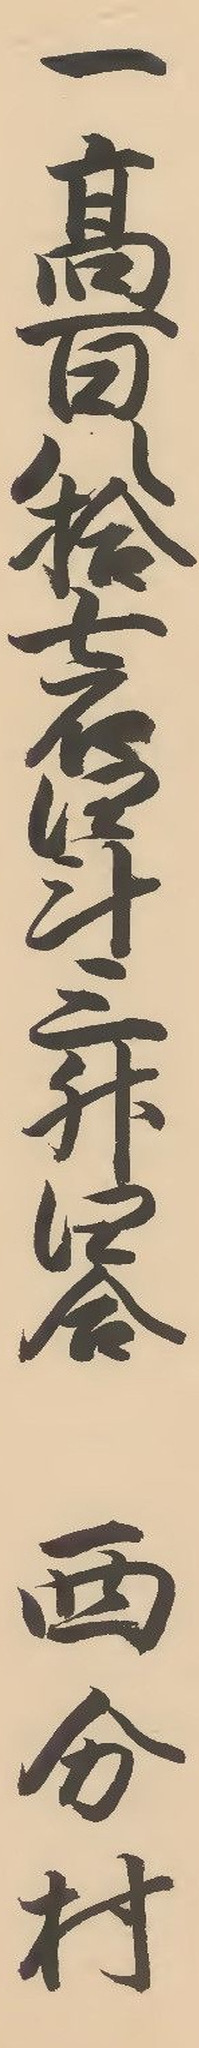一高百八拾七石四斗三升四合西分村

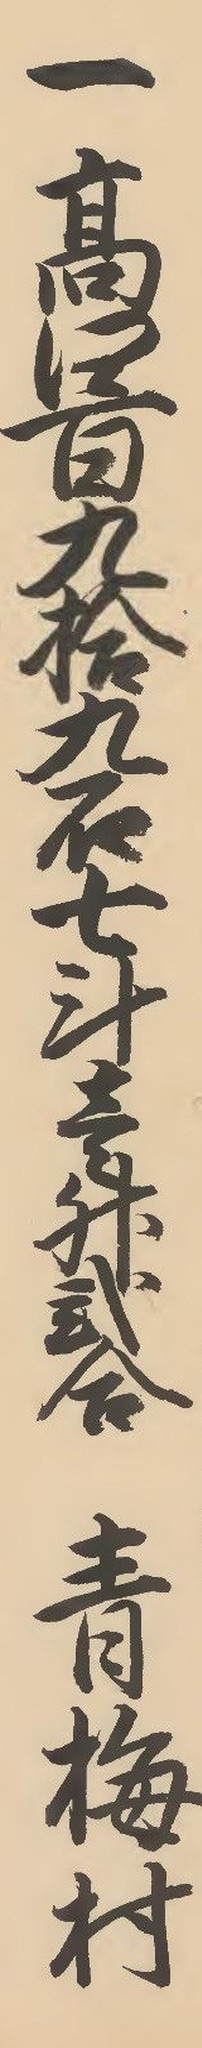一高四百九拾九石七斗壱升弐合青梅村
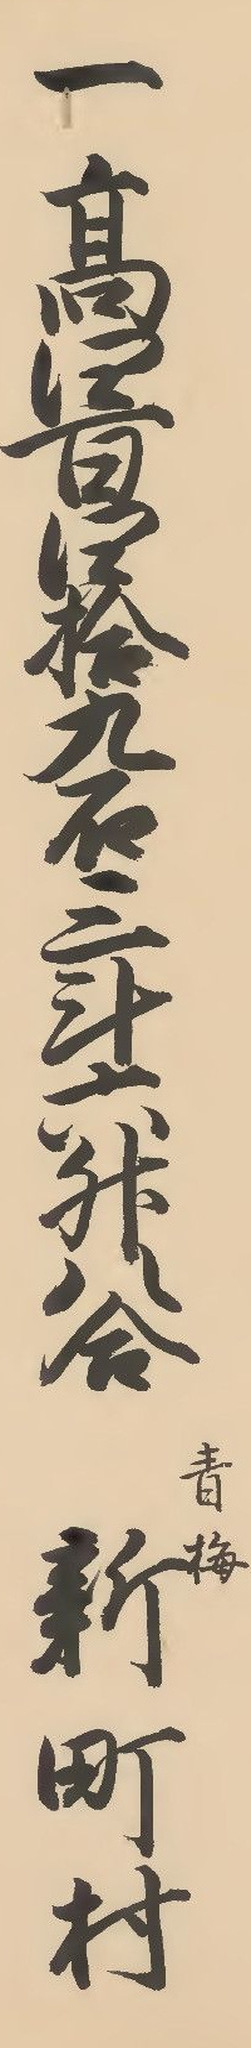一高四百四拾九石三斗六升八合新町村
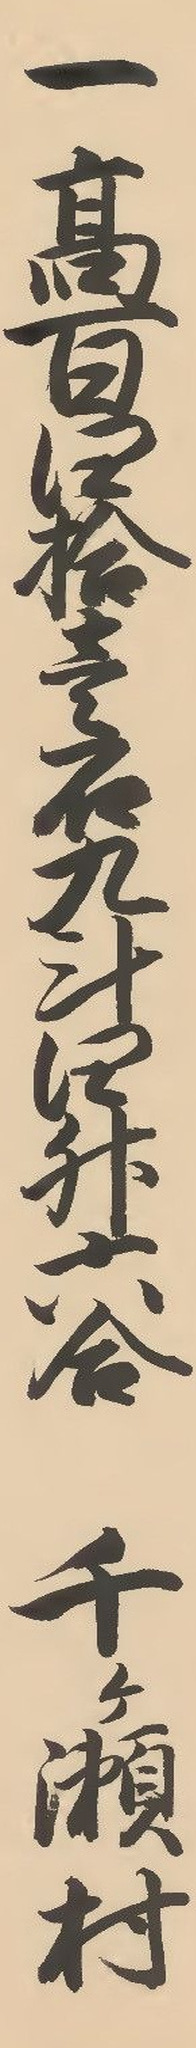一高百四拾壱石九斗四升六合千ヶ瀬村
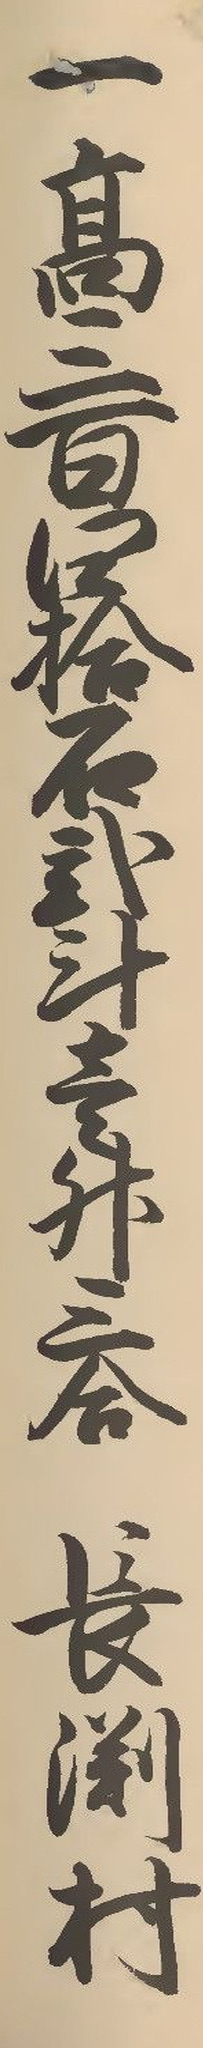一高三百四拾石弐斗壱升三合長渕村
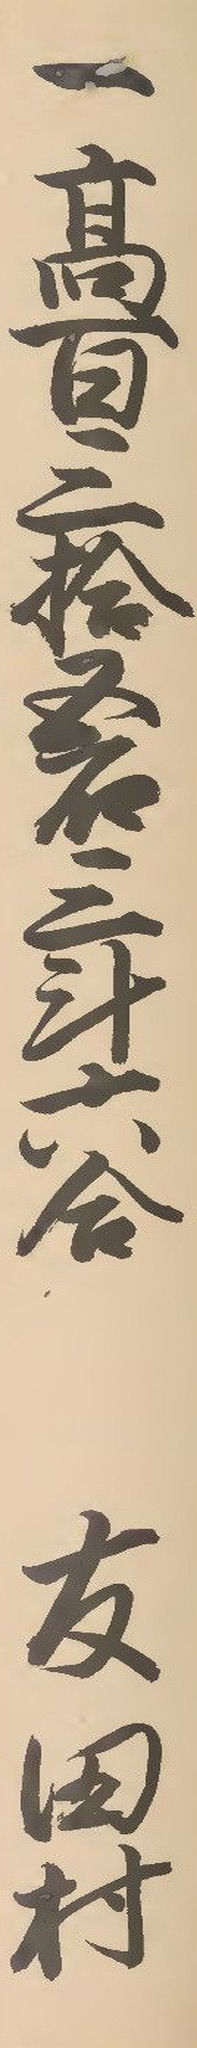一高百三拾五石三斗六合友田村
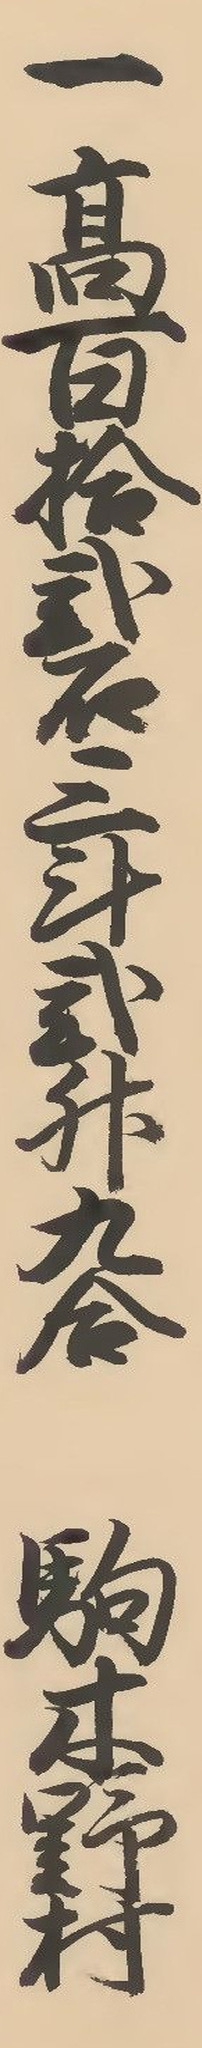一高百拾弐石三斗弐升九合駒木野村
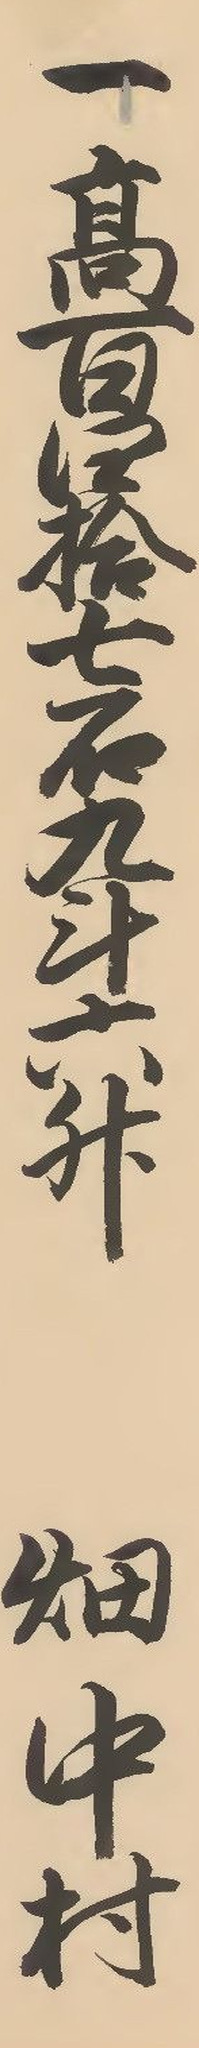一高百四拾七石九斗六升畑中村
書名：武蔵国郷帳　上
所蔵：国立公文書館 National Archives of Japan
